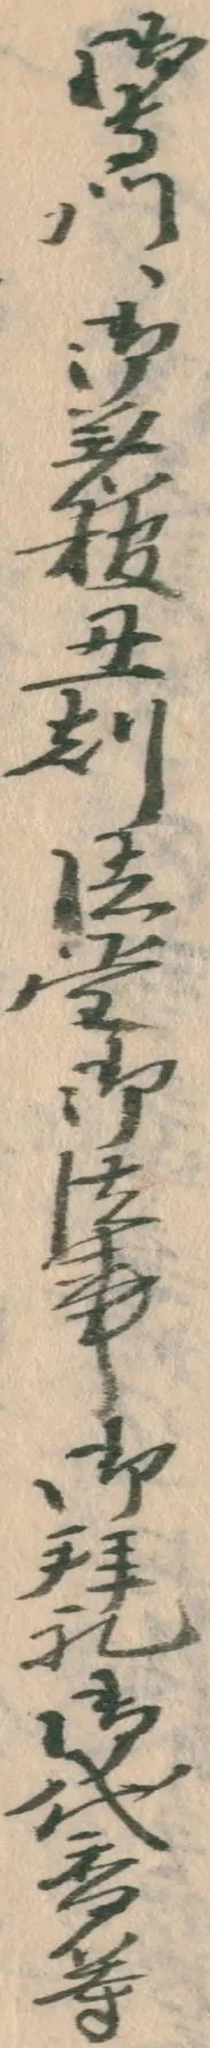御寺門へ御着披丑刻法堂御法事御拝礼御代香等
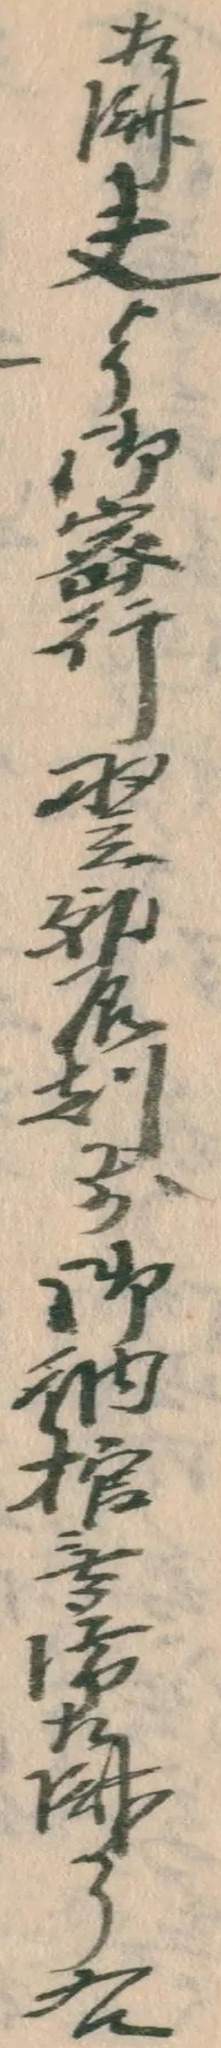相済夫より御密行翌朝辰刻前御納棺無滞相済了右
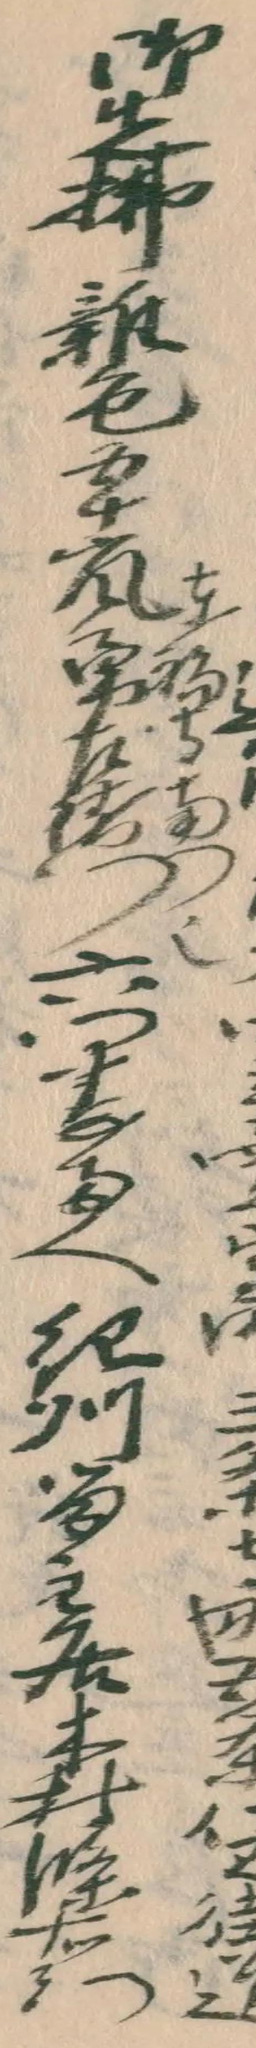御先払雑毛五十嵐勇左衛門六門書両人紀州留主居木村條右衛門
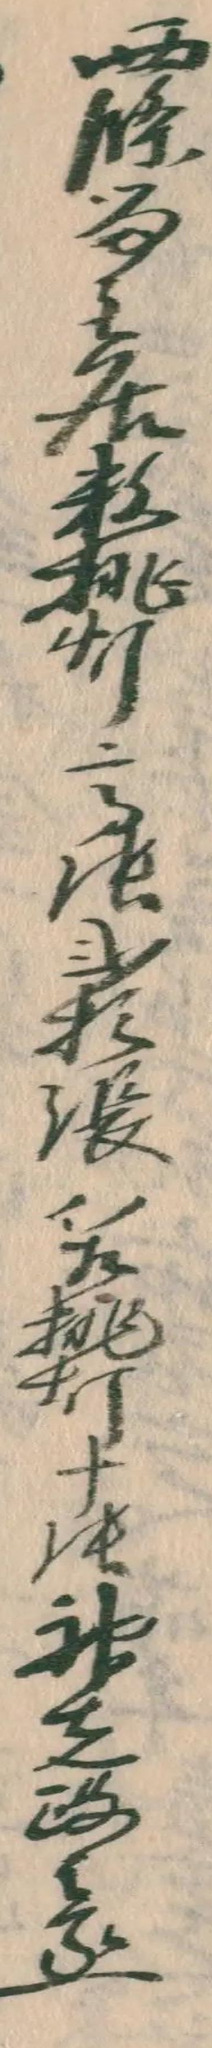西條留之居数挑灯高張弐拾張箱挑灯十張神先政之丞
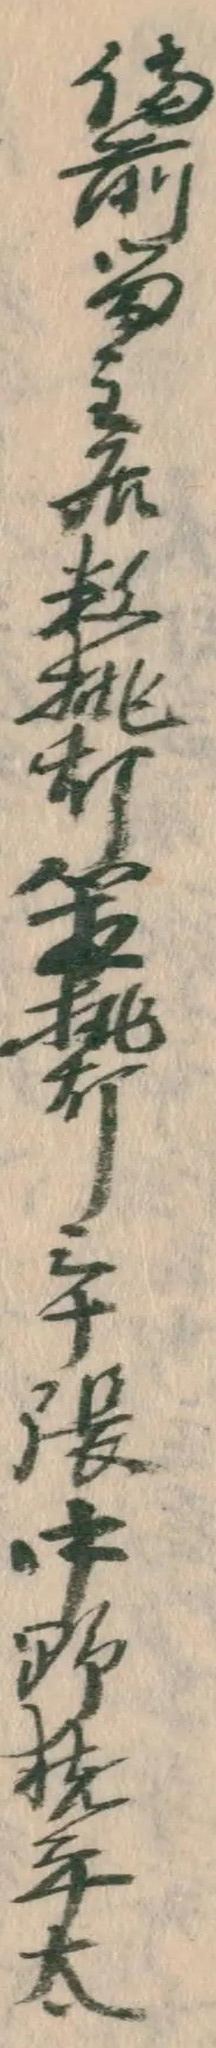備前留守居数挑灯箱挑灯三十張中野猪平太
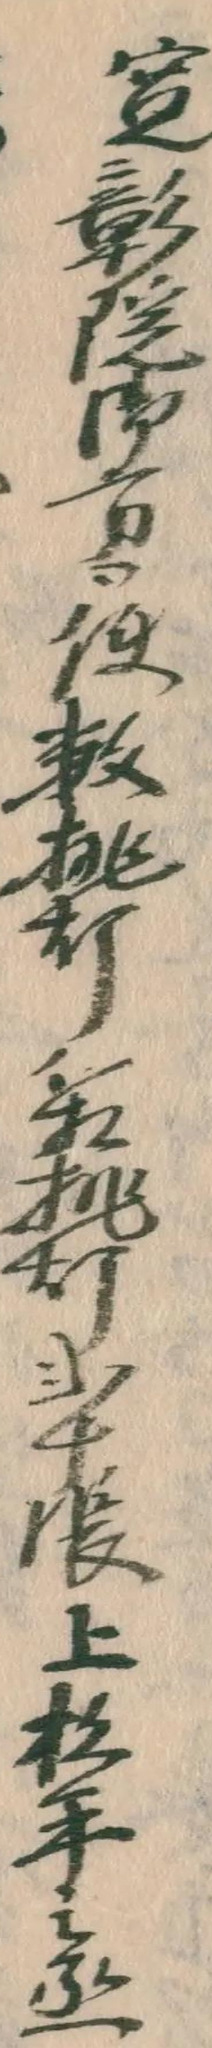寛彰院御方御使数挑灯箱挑灯弐十張上松平之丞
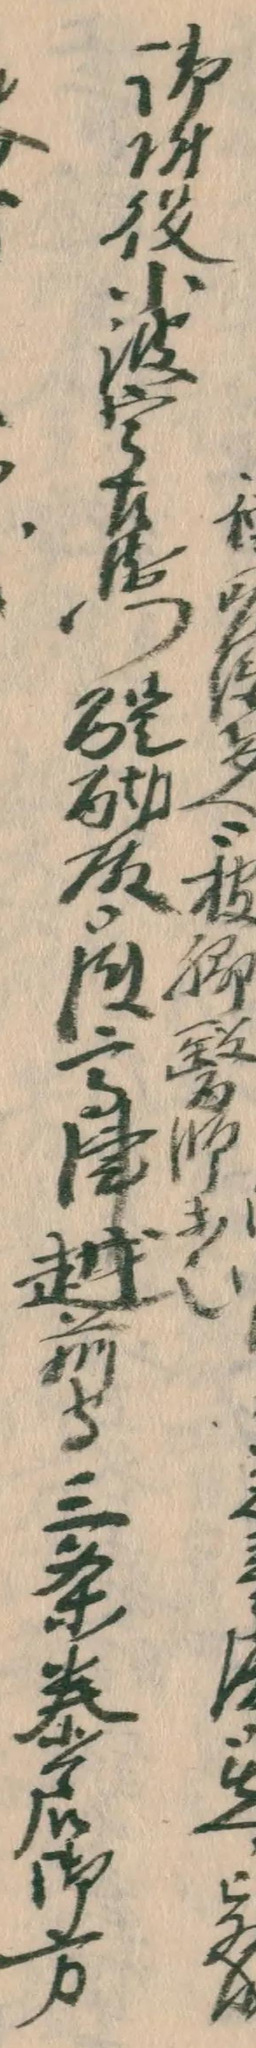御附役小波宇左衛門醍醐殿御使高津越前守三条泰康御方
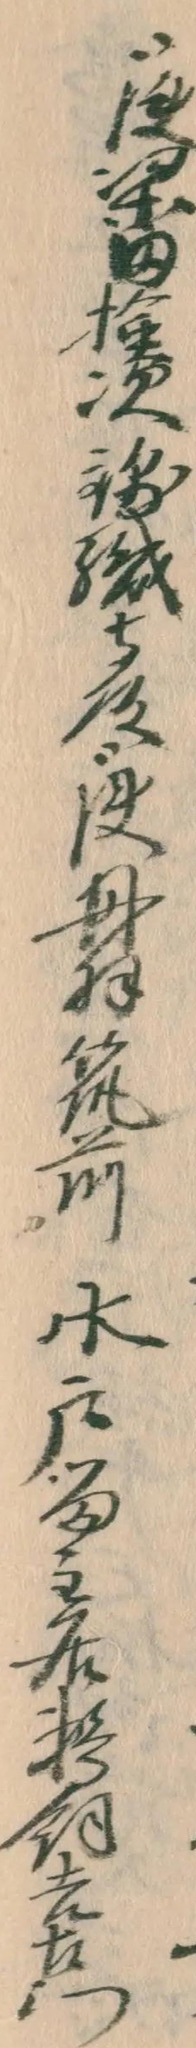御使梁田検次錦織守殿は使丹羽筑前水戸留主居鵜飼吉左衛門
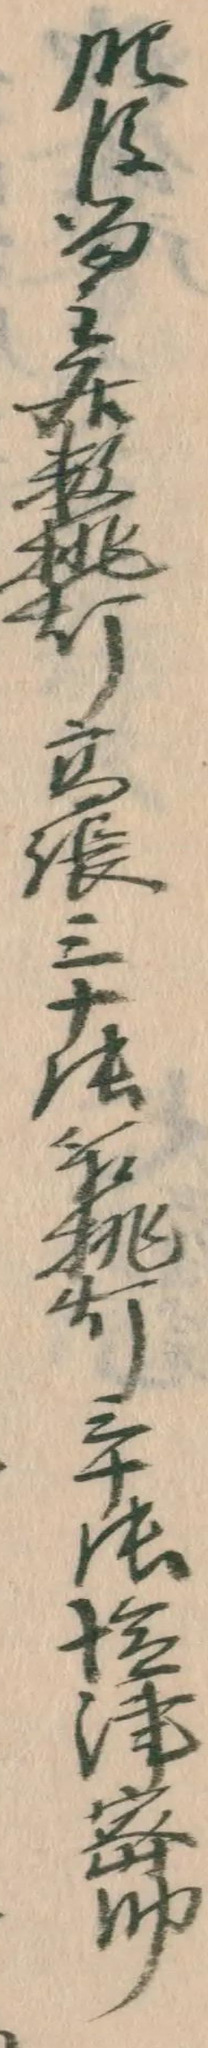肥後留主居数挑灯高張三十張箱挑灯三十張塩津密助
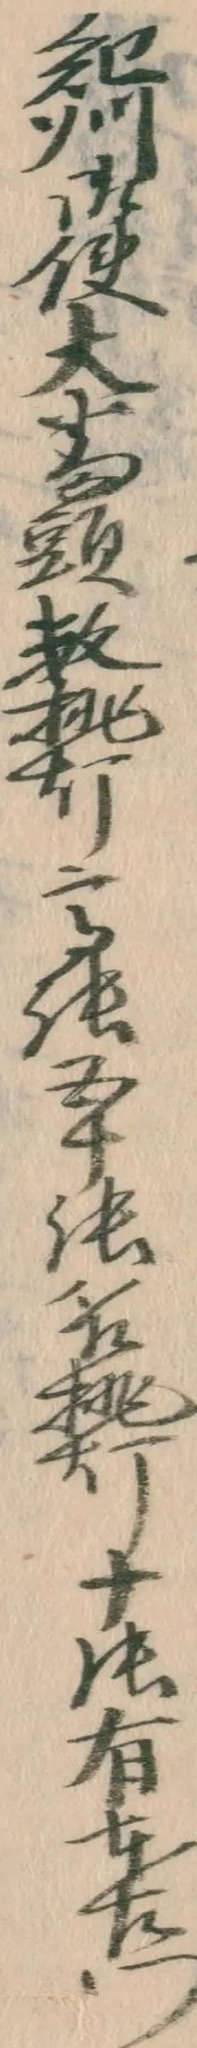紀州御使大番頭数挑灯高張五十張箱挑灯十張有本左衛門
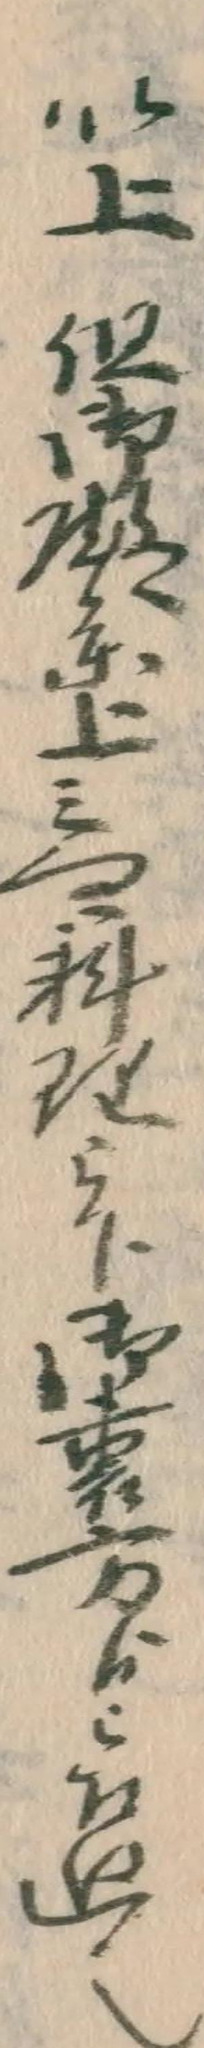以上但御殿ヘ参上之郷料理被下御裏方ゟ被召廻也
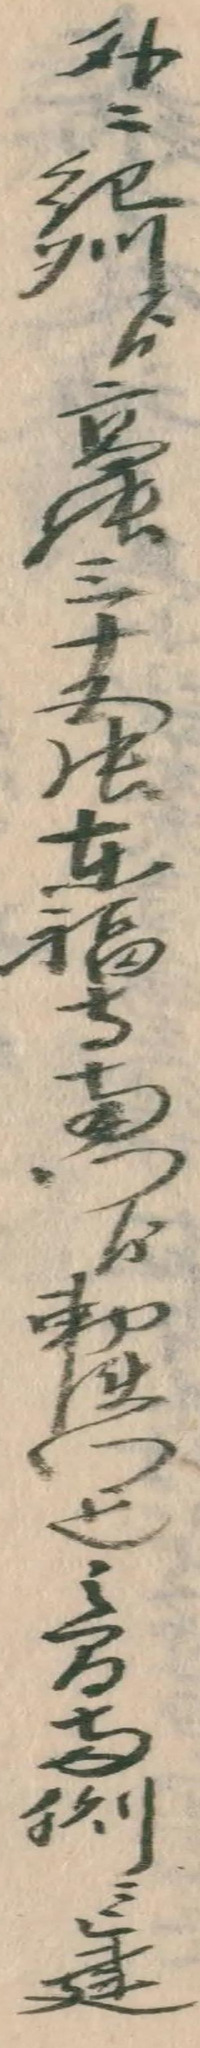外ニ紀州ゟ高張三十五張東福寺南門ゟ勅使門迄之間両側に被建
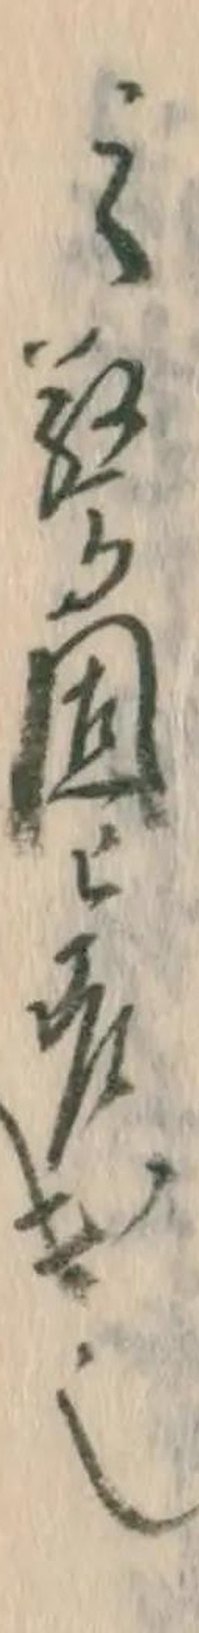之驚固ニ差出也
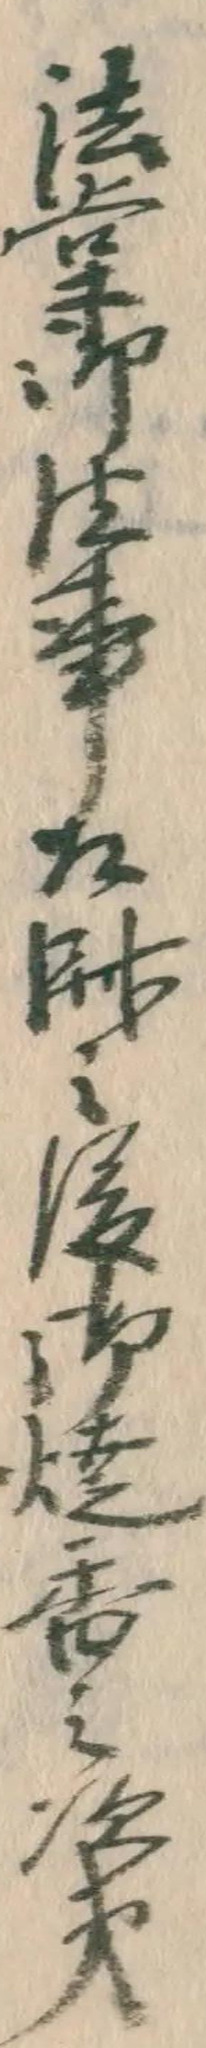法堂御法事相済之後御焼香之次第
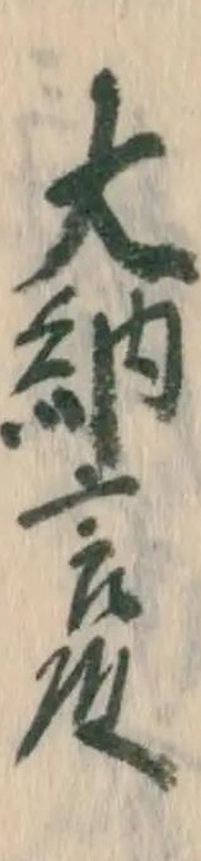大納言殿
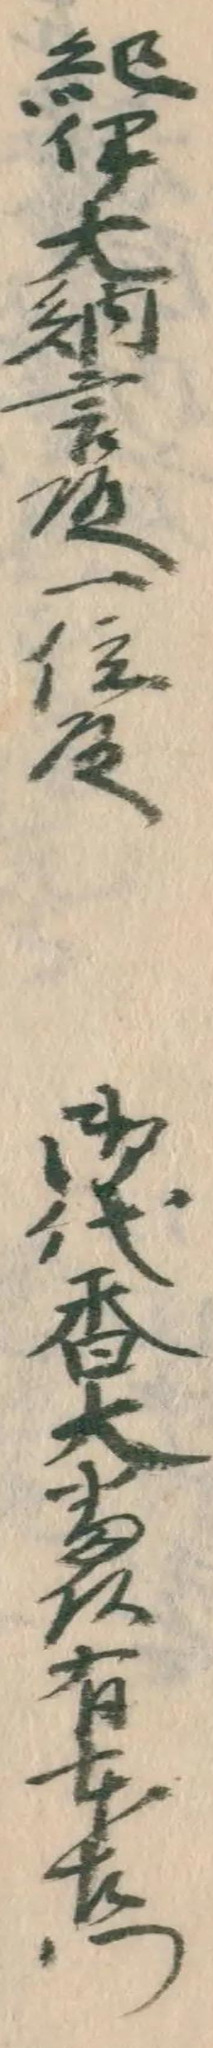紀伊大納言殿一位殿御代香大番頭有本左衛門
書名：賀茂社記録. 第69冊
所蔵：国立国会図書館 National Diet Library, JAPAN
